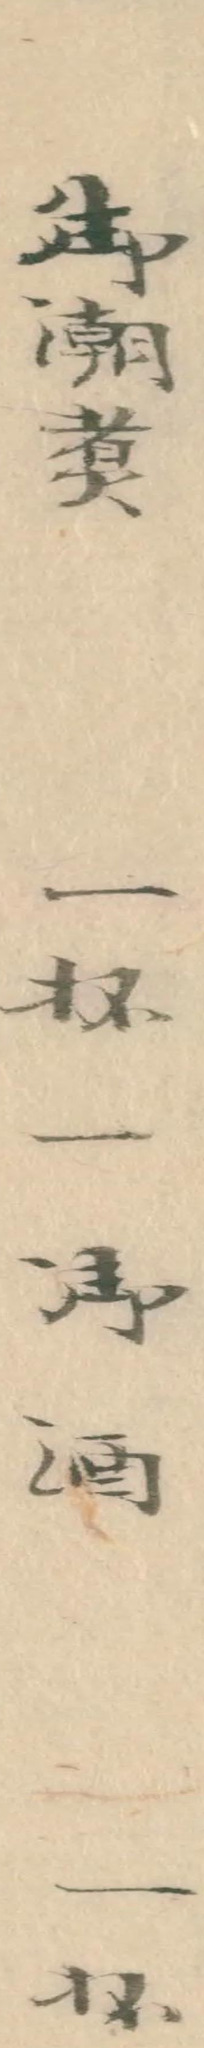一御潮煮一杯一御酒一抔
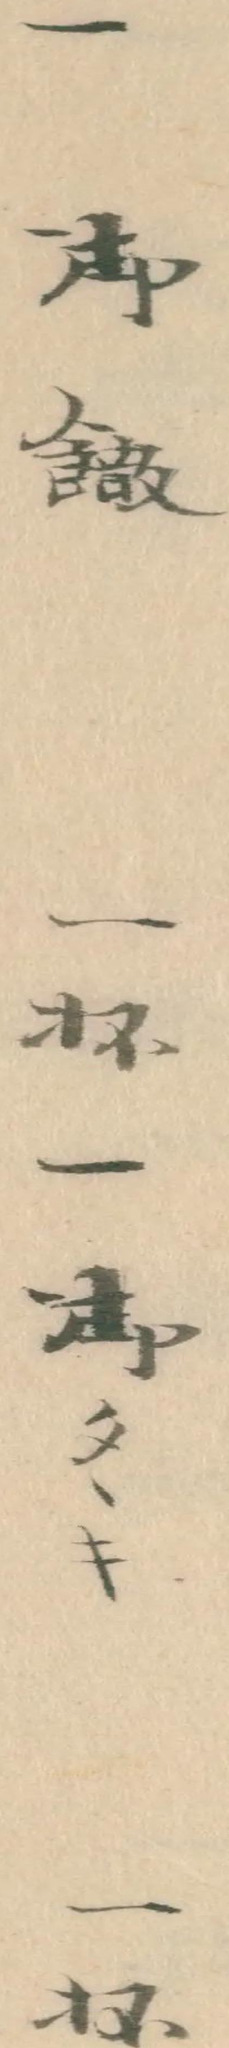一御饊一抔一御タヽキ一抔
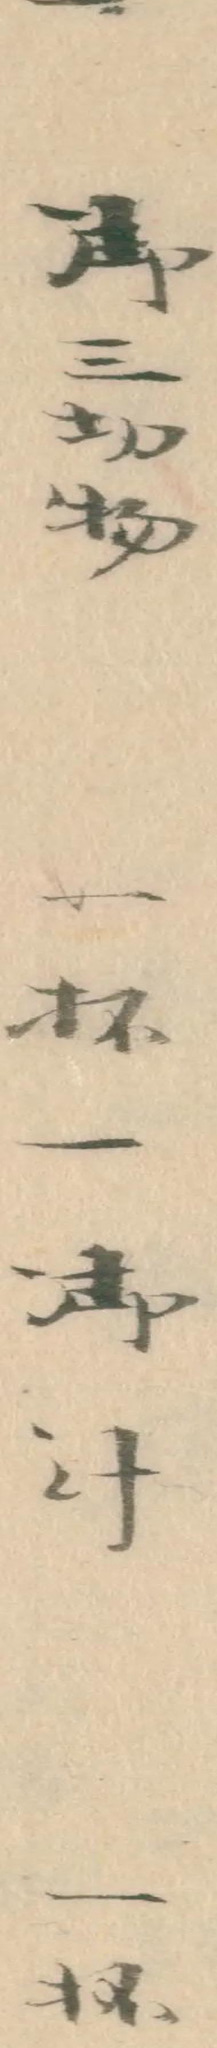一御三切物一杯一御汁一抔
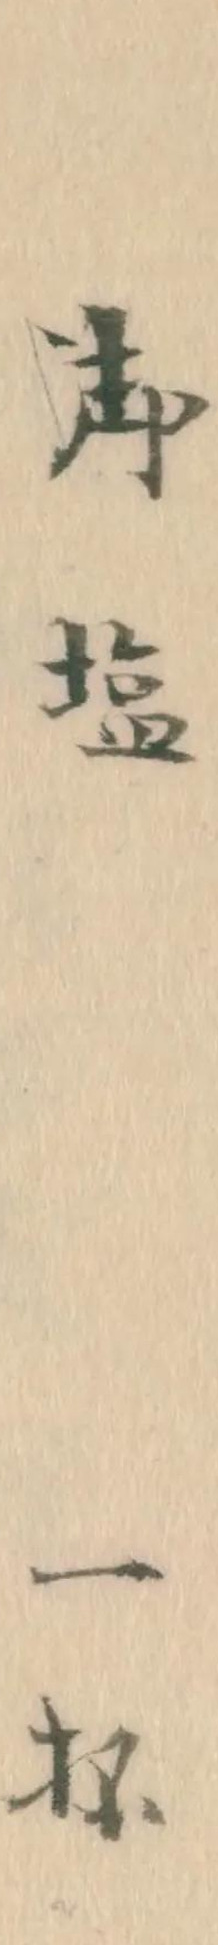一御塩一抔
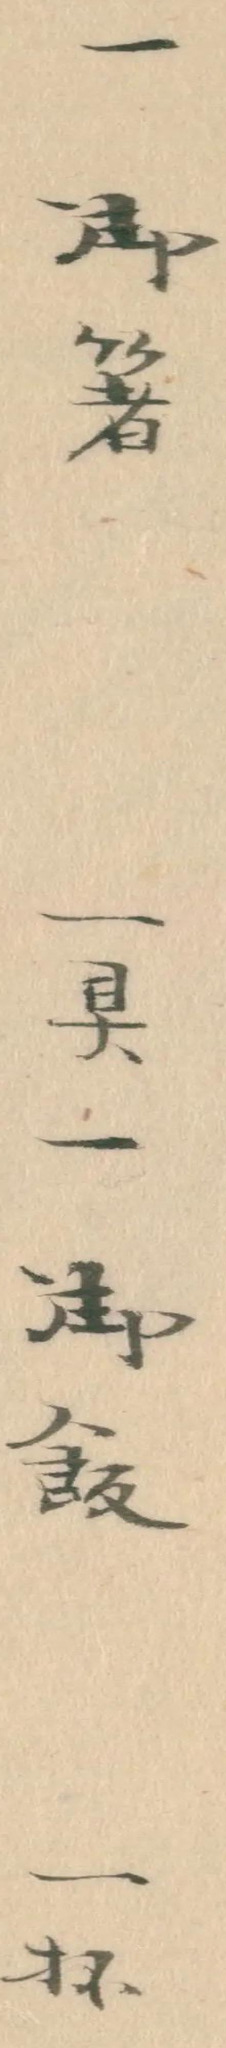一御箸一具一御飯一抔
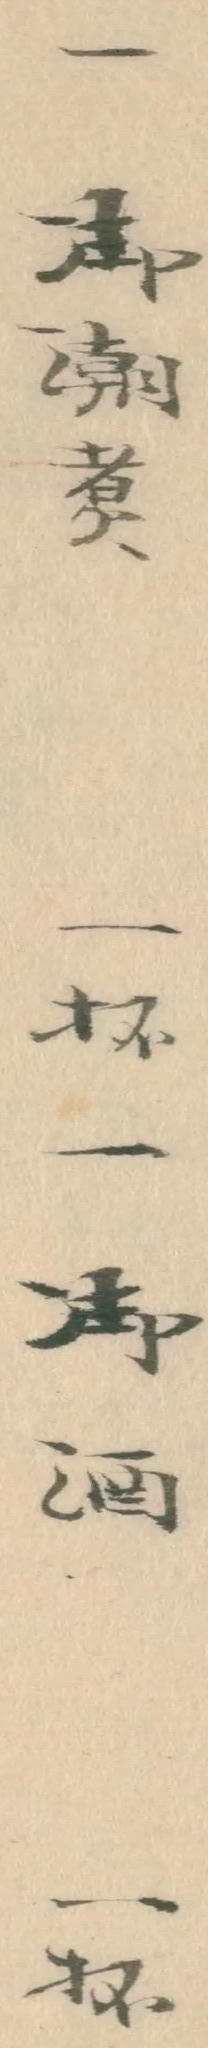一御潮煮一杯一御酒一抔
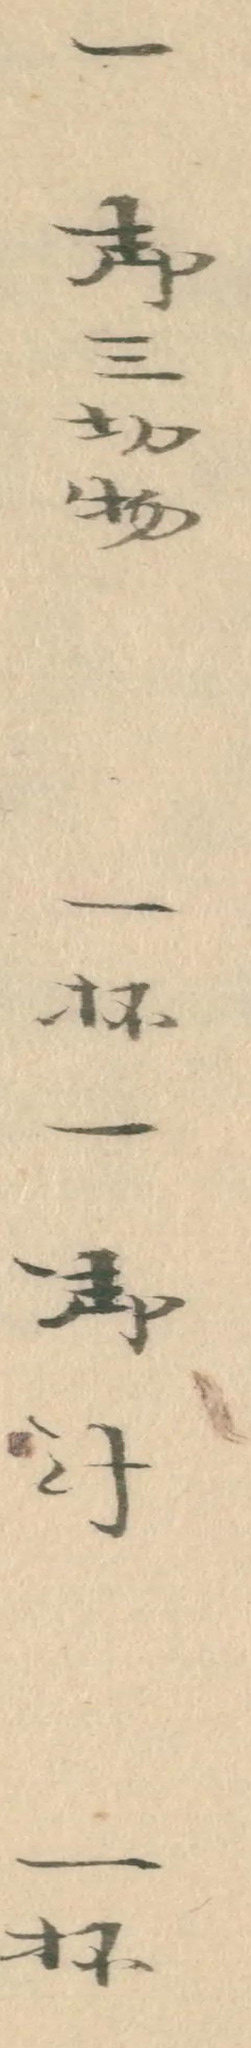一御三切物一杯一御汁一抔
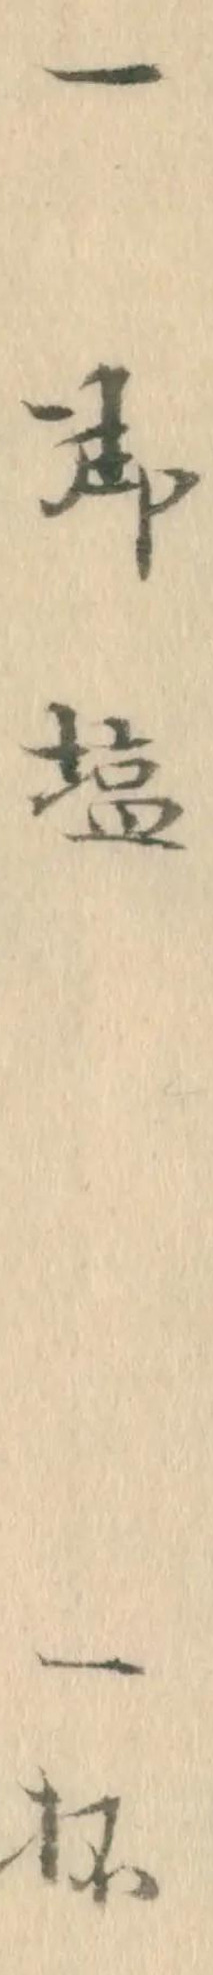一御塩一抔
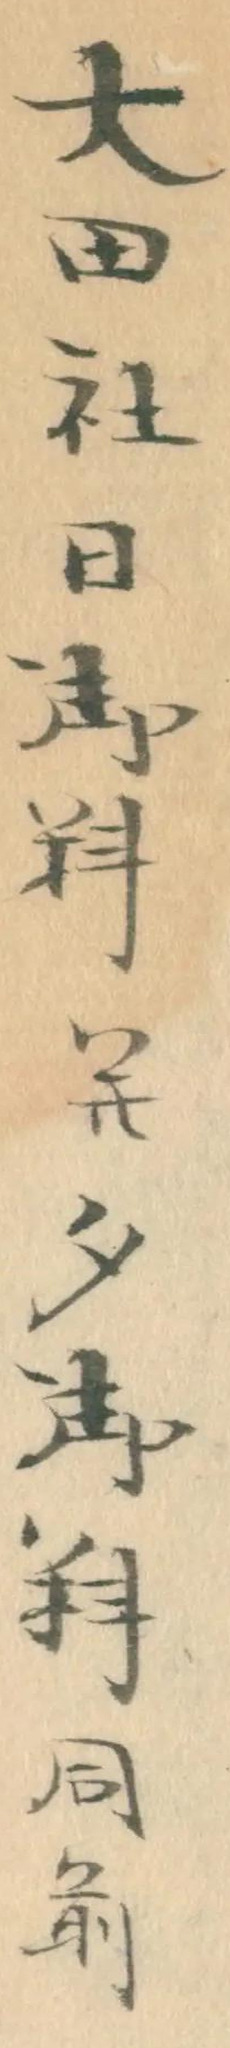大田社日御料并夕御料同前

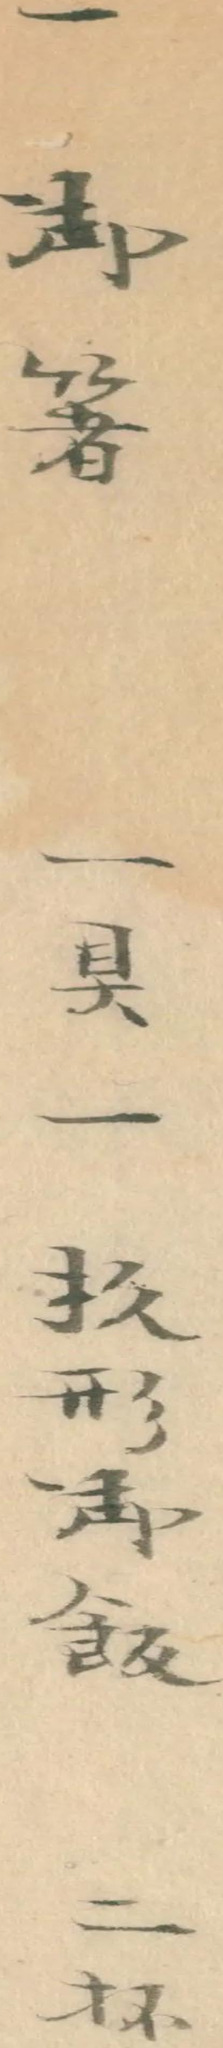一御箸一具一杉形御飯二抔
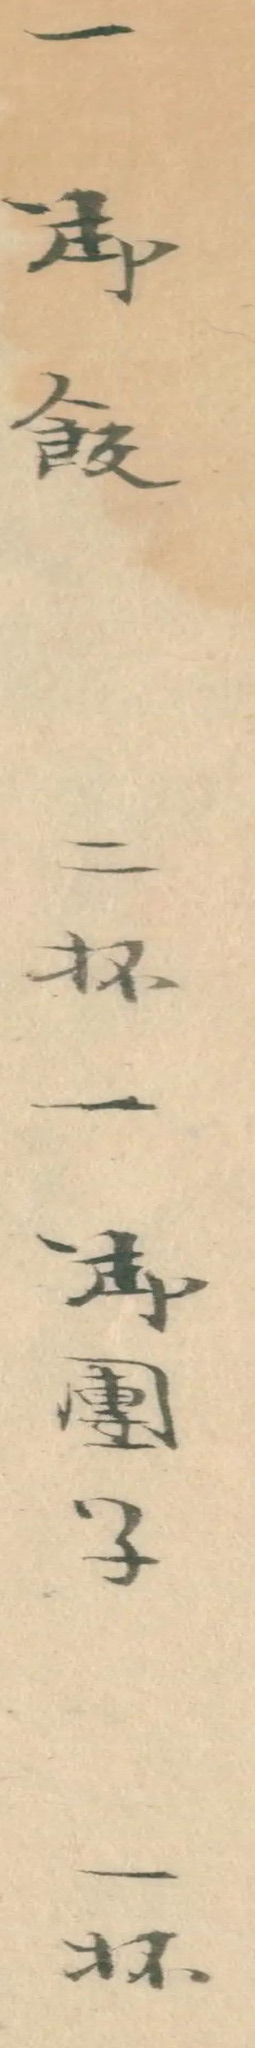一御飯二抔一御団子一抔
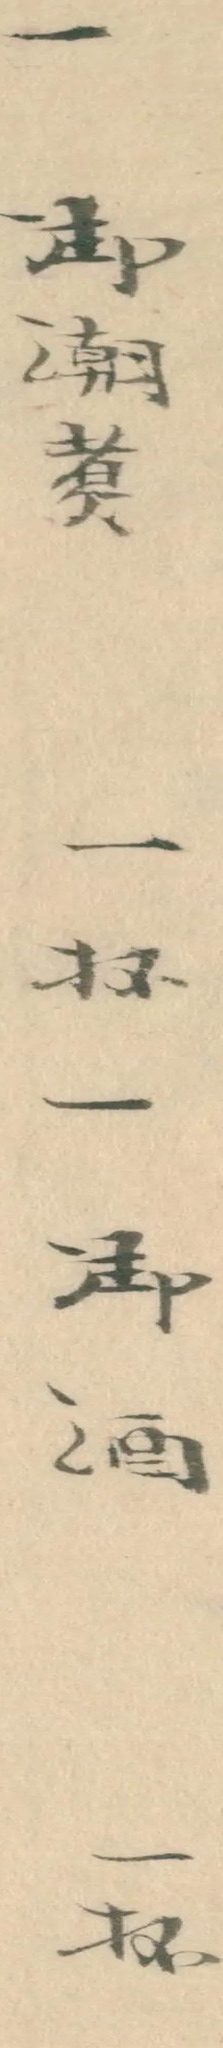一御潮煮一抔一御酒一抔
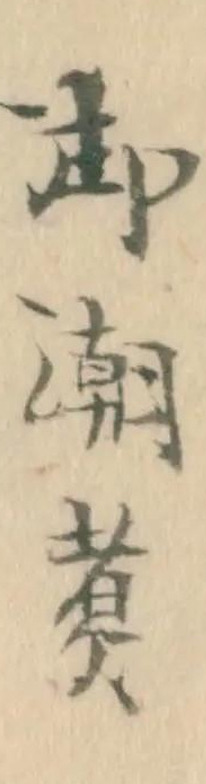御潮煮
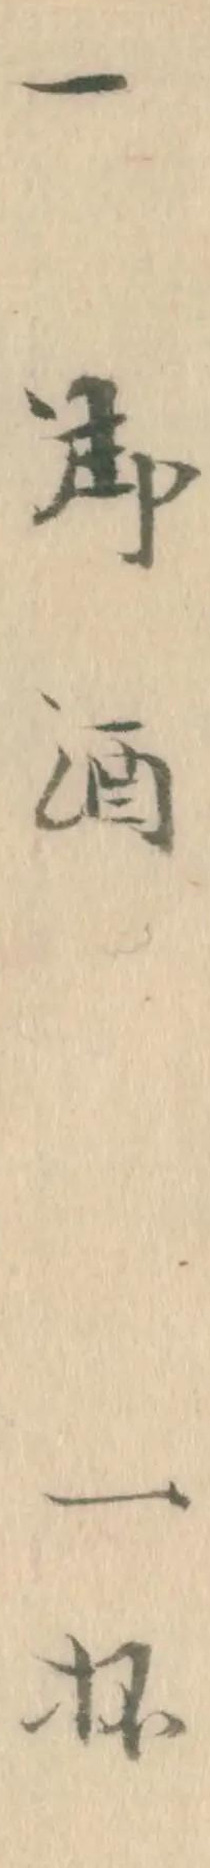一御酒一抔

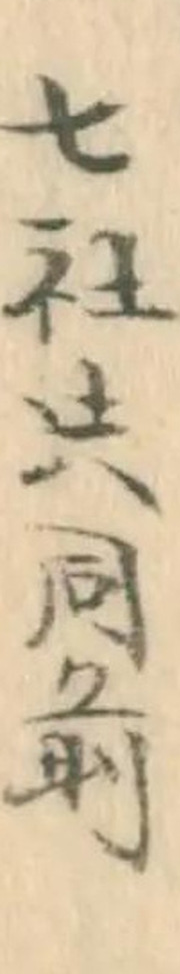七社共同前
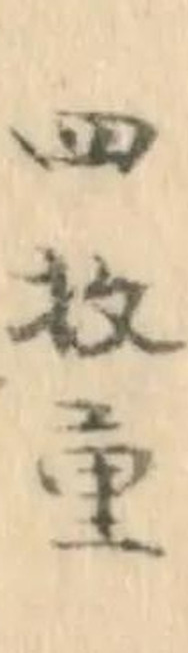二枚重
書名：葵御祭供進之神饌諸品色目書
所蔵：国立国会図書館 National Diet Library, JAPAN
